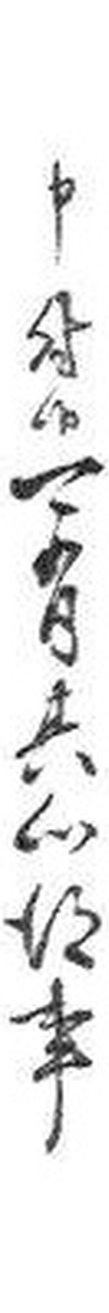申付候可有其心得事
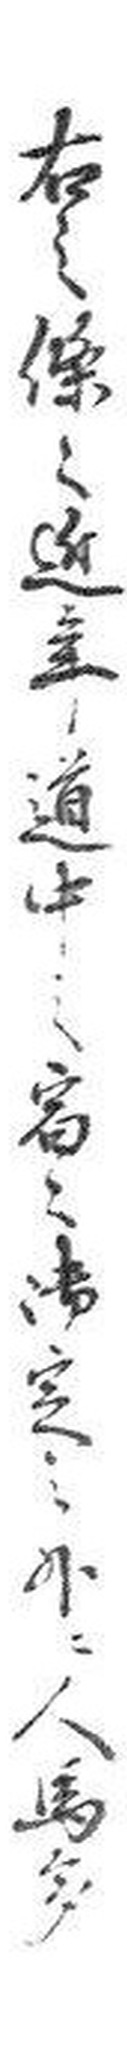右之條々近年道中之宿々御定之外ニ人馬多
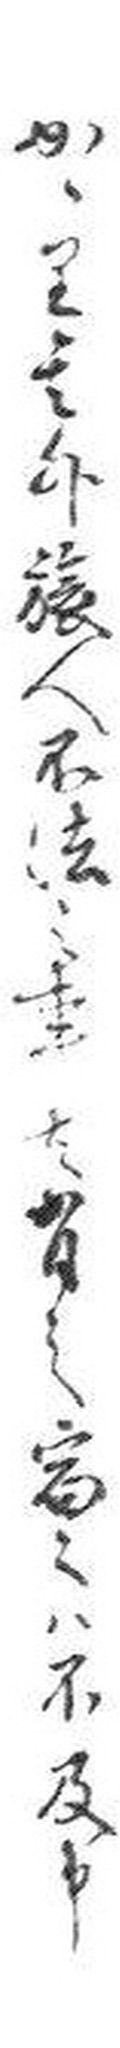かゝり其外旅人不法之事共有之宿々ㇵ不及申
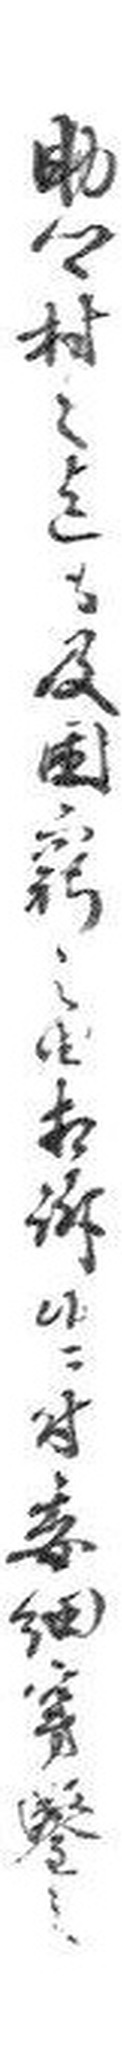助郷村々迄も及困窮之由相訴候ニ付委細穿鑿之
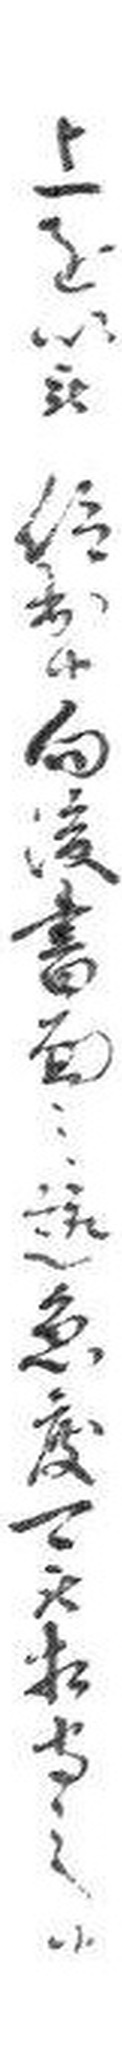上を以被仰出候向後書面之趣急度可被相守之候
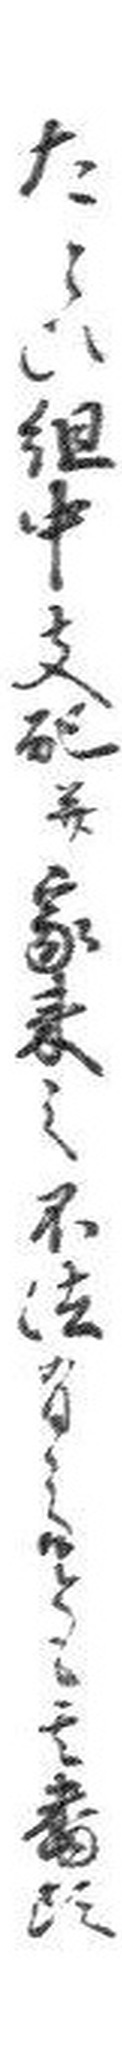たとひ組中支配并家来之不法有之候とも其番頭
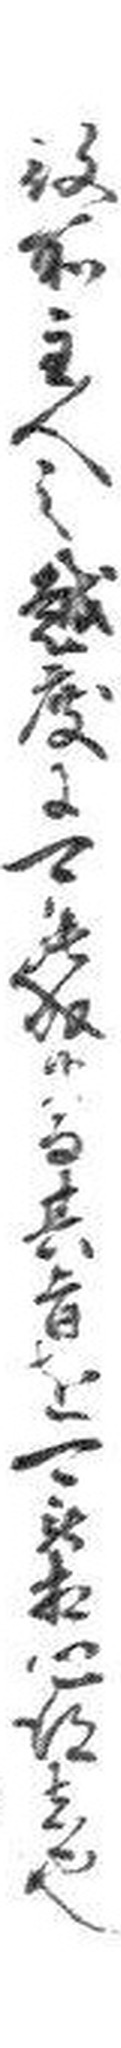役所主人之越度に可被成候間其旨を可被相心得者也
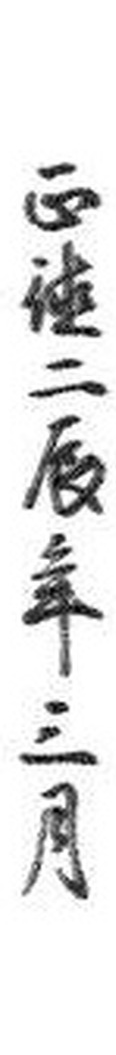正徳二辰年三月
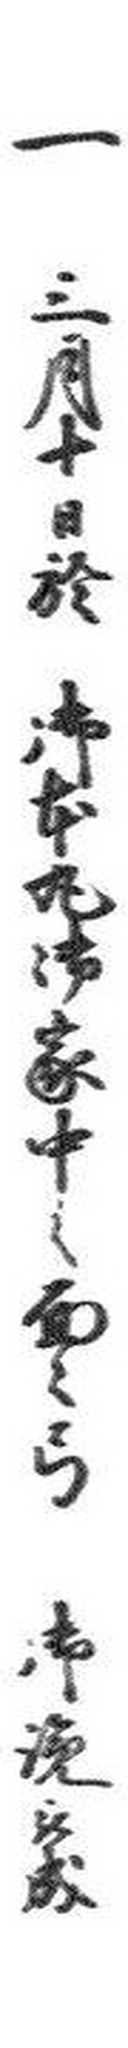一三月十日於御本丸御家中之面々弓御覧被成
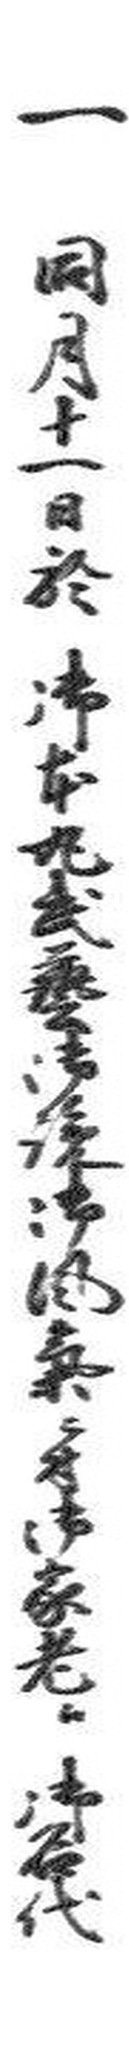一同月十一日於御本丸武芸御覧御風気ニ付御家老江御名代
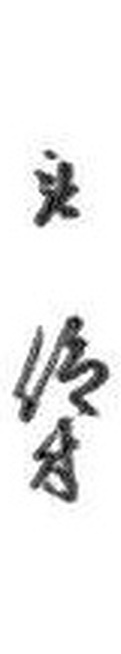被仰付
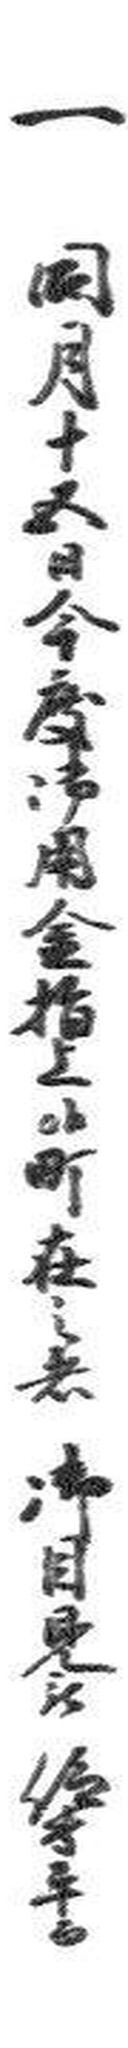一同月十五日今度御用金指上候町在之者御目見被仰付畢而
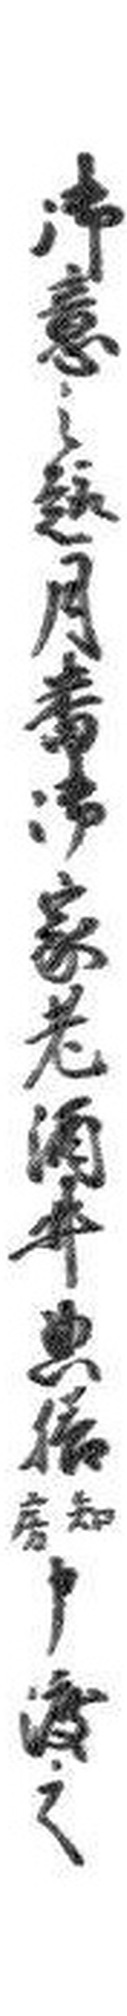御意之趣月番御家老酒井典膳知房申渡之
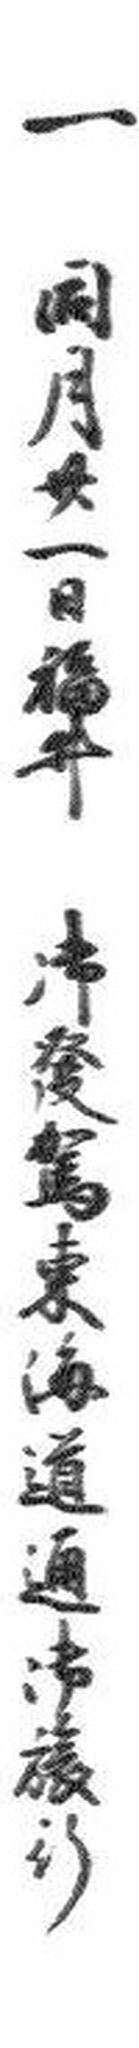一同月廿一日福井御発駕東海道御旅行
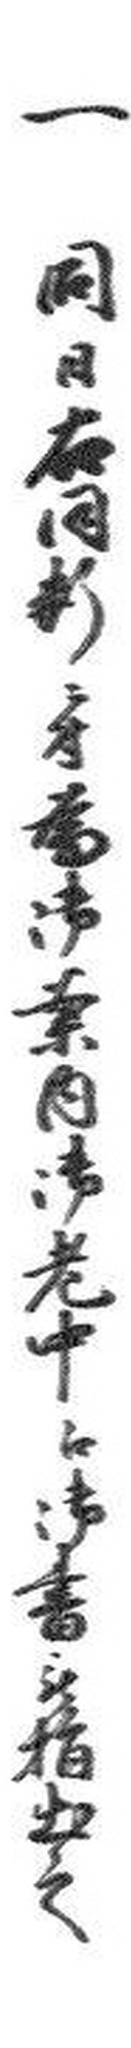一同日右同断ニ付為御案内御老中江御書被指出之
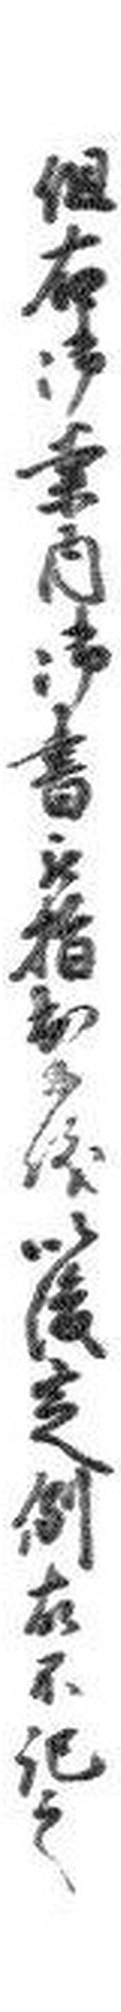但右御案内御書被指出候儀以後定例故不記之
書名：家譜 二十九 吉邦公 従正徳二年到正徳三年
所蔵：福井県文書館 Fukui Prefectural Archives
